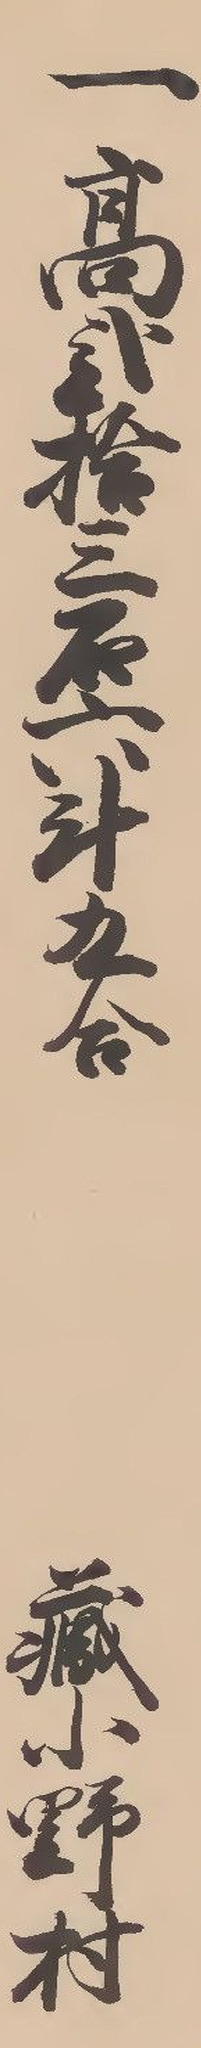一高弐拾三石六斗九合蔵小野村
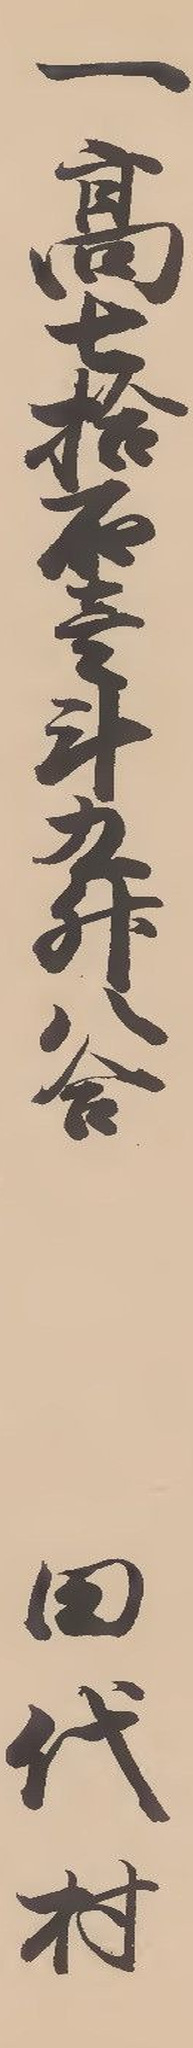一高七拾石壱斗九升八合田代村
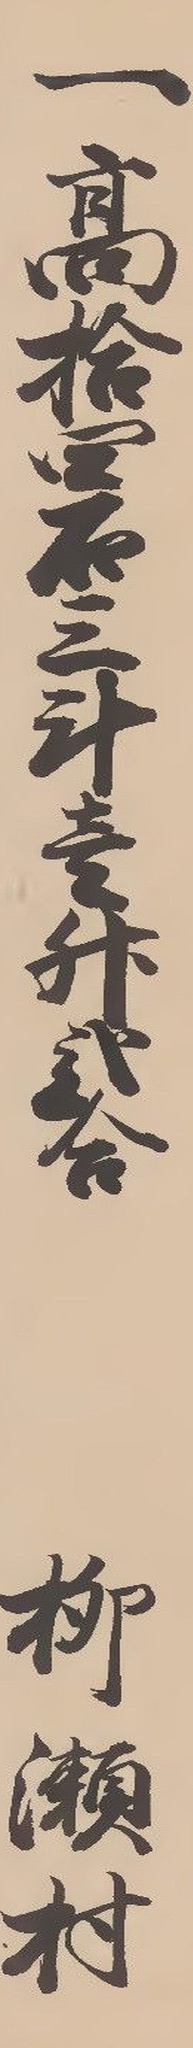一高拾四石三斗壱升弐合柳瀬村
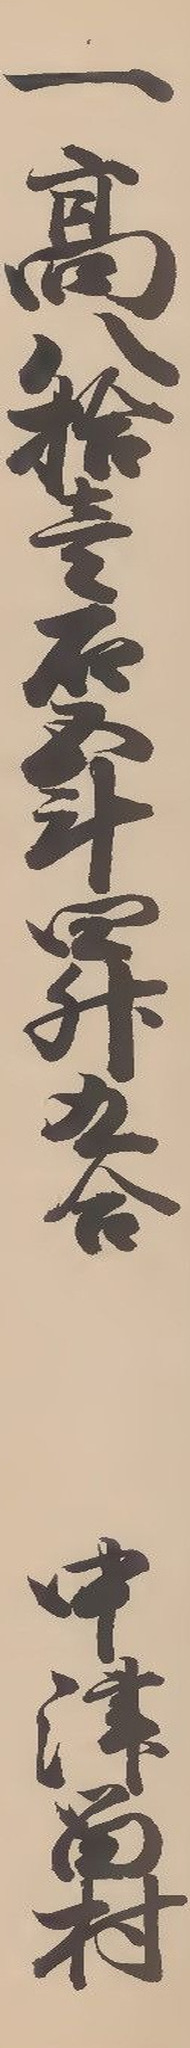一高八拾壱石五斗四升九合中津留村
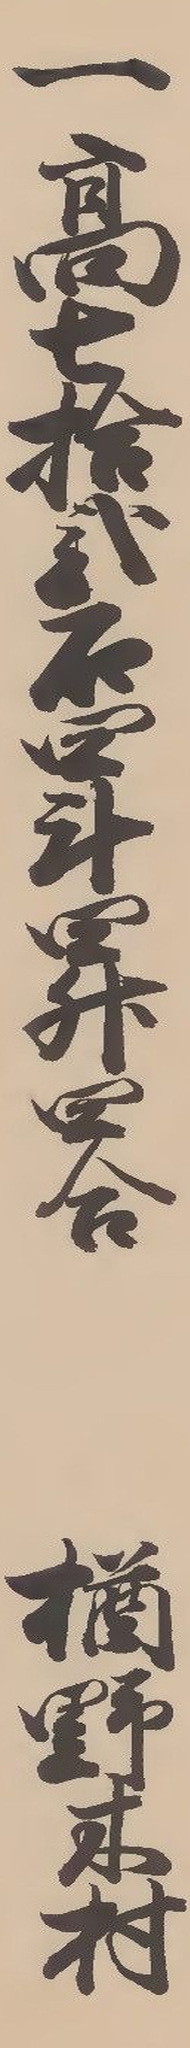一高七拾弐石四斗四升四合楢野木村
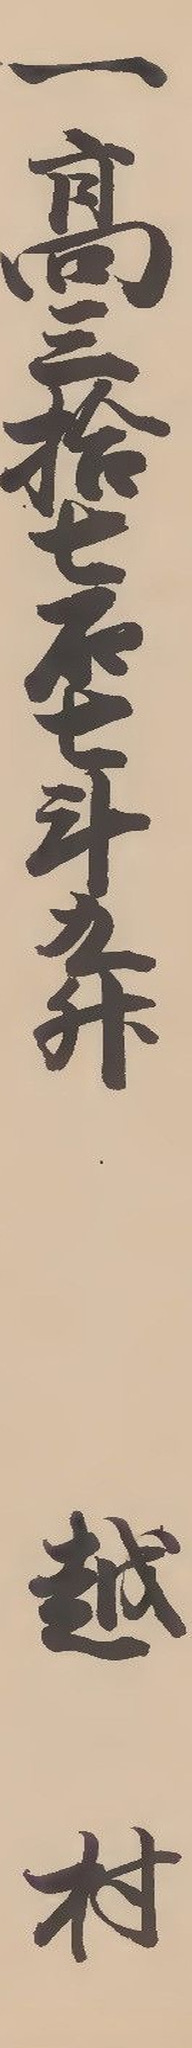一高三拾七石七斗九升越村
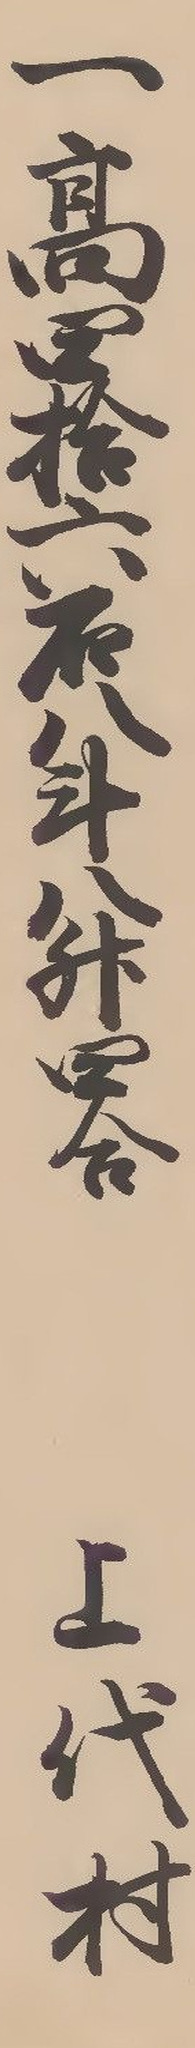一高四拾六石八斗八升四合上代村

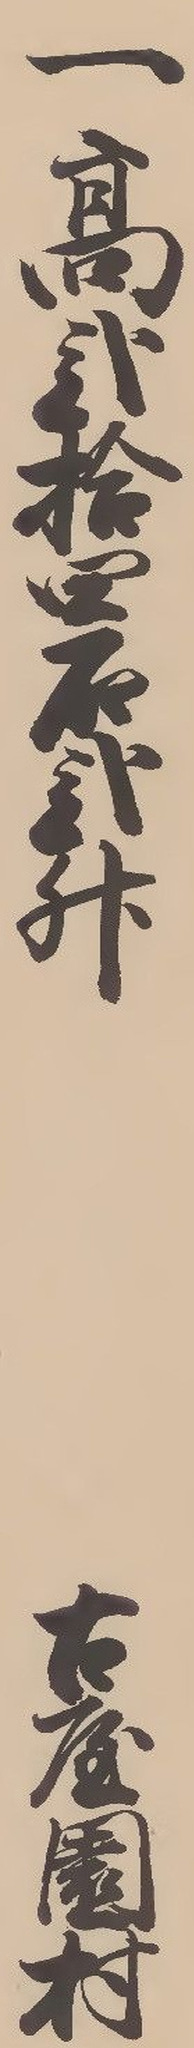一高弐拾四石弐升古屋園村
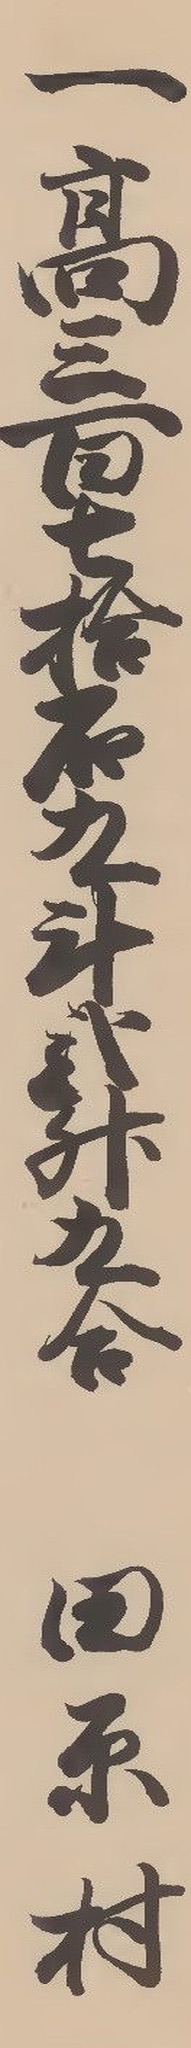一高三百七拾石九斗弐升九合田原村
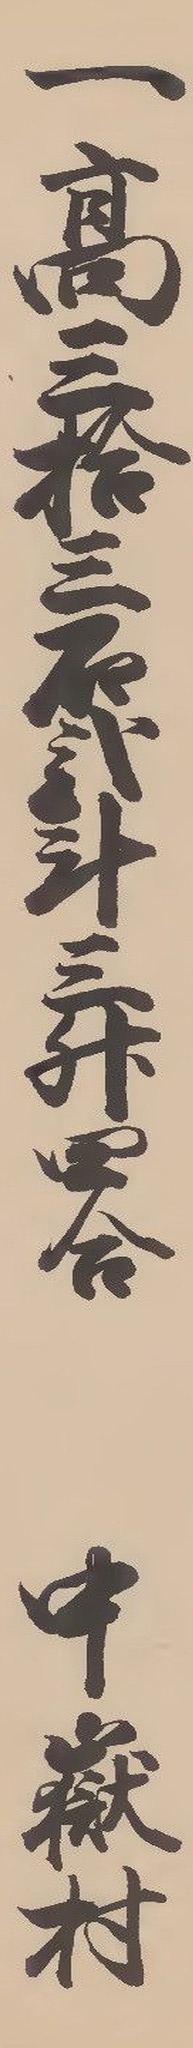一高三拾三石弐斗三升四合中嶽村
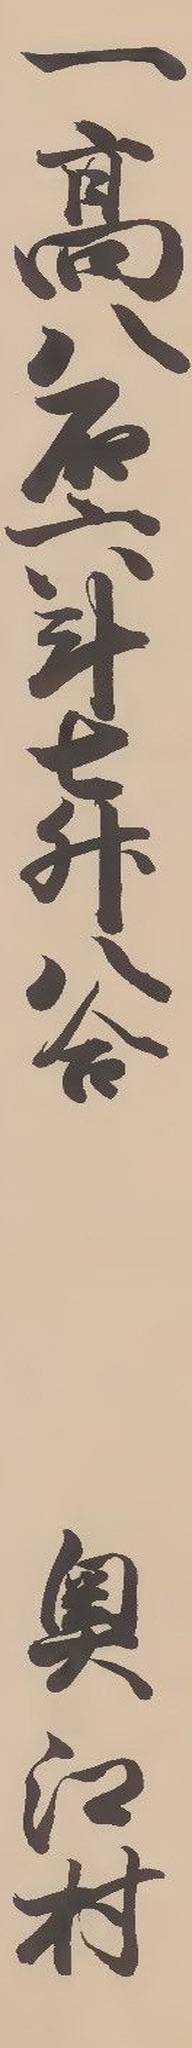一高八石六斗七升八合奥江村
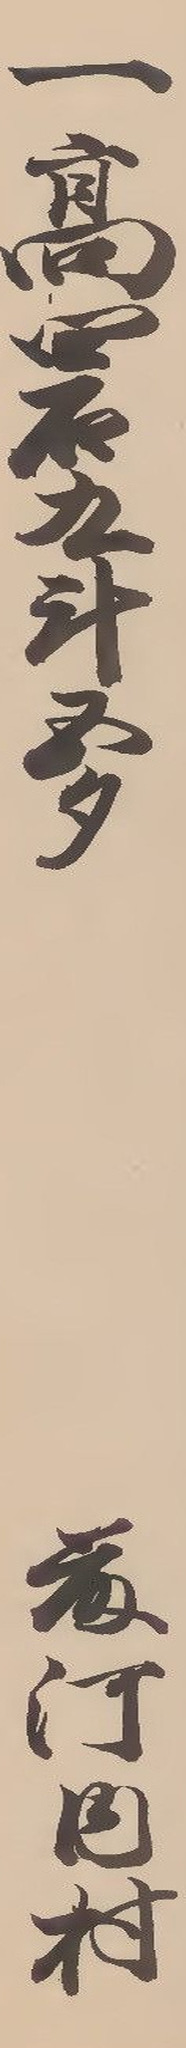一高四石九斗五勺藤河内村
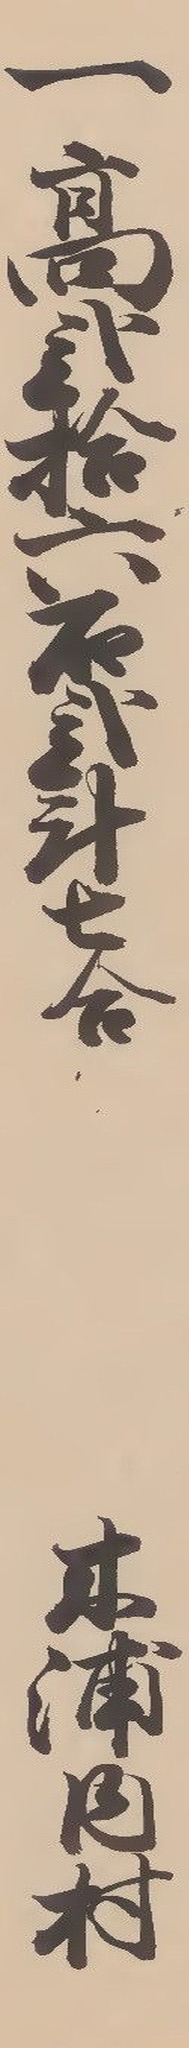一高弐拾六石弐斗七合木浦内村
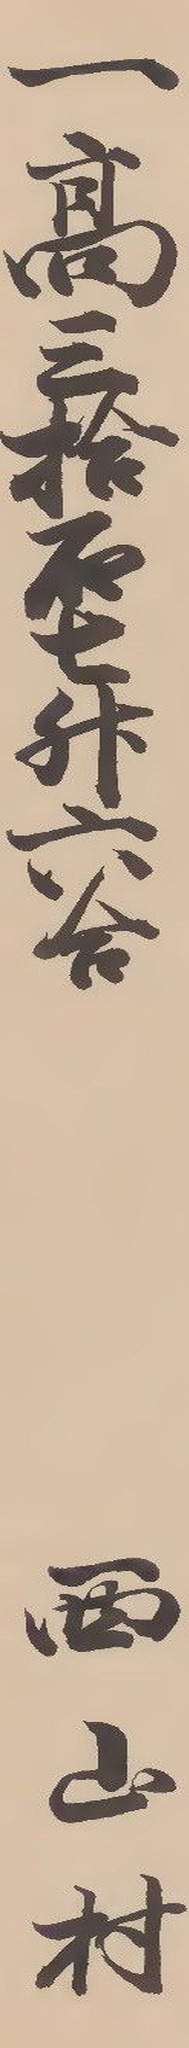一高三拾石七升六合西山村
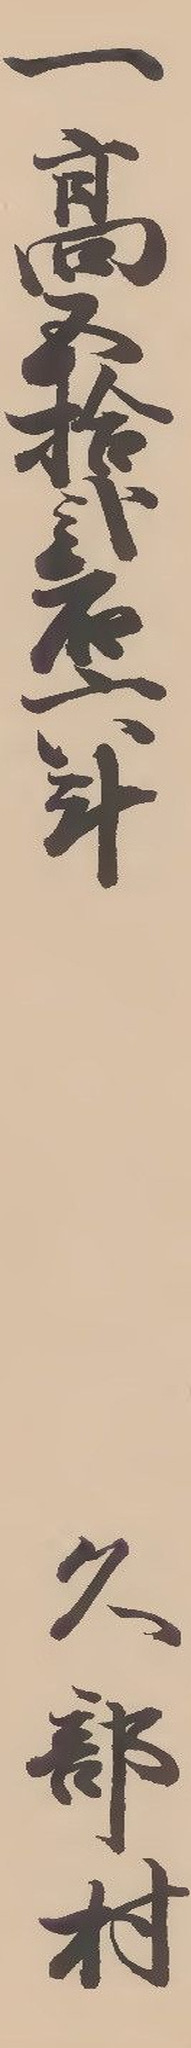一高五拾弐石六斗久部村

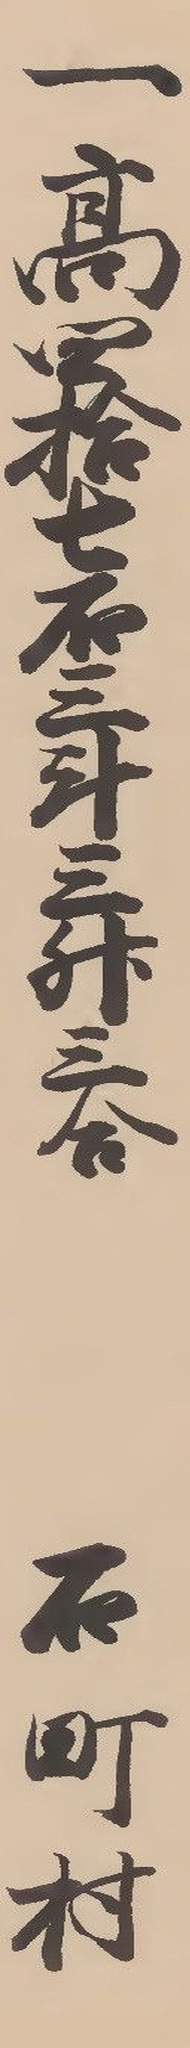一高四拾七石三斗三升三合石町村
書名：豊後国郷帳
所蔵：国立公文書館 National Archives of Japan
